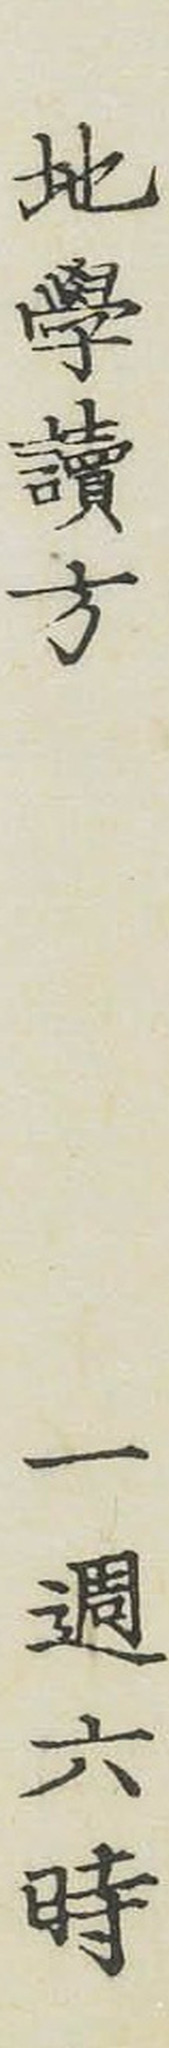地学読方一週六時
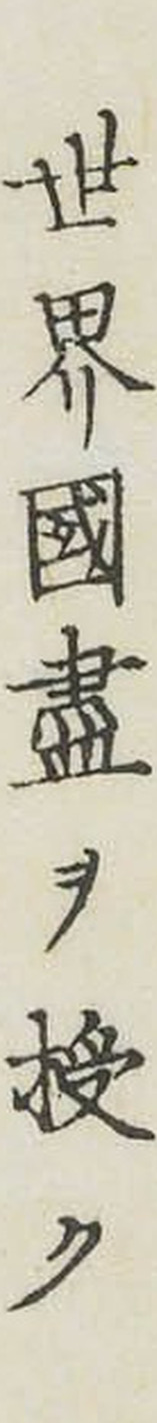世界国盡ヲ授ク
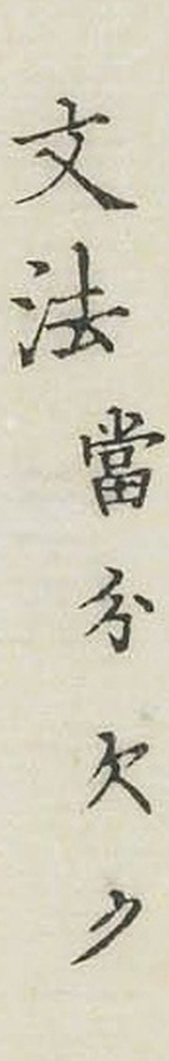文法当分欠ク
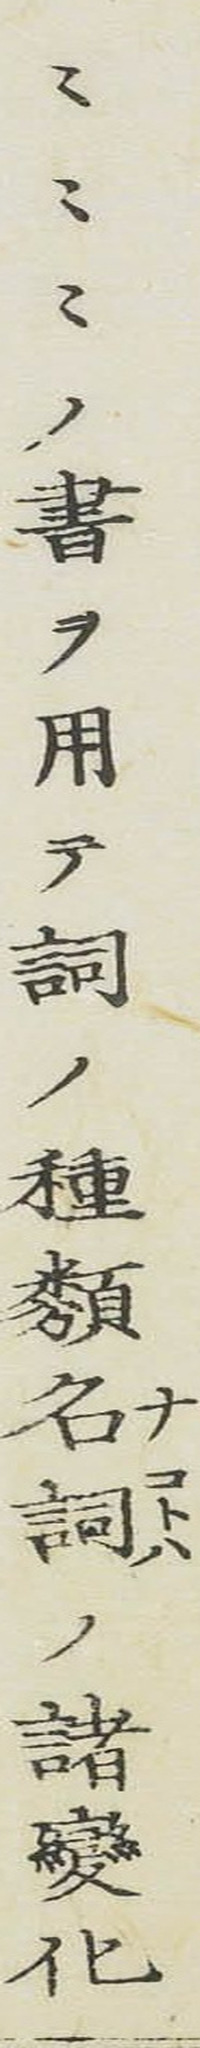ゝゝゝノ書ヲ用テ詞ノ種類名詞ノ諸変化
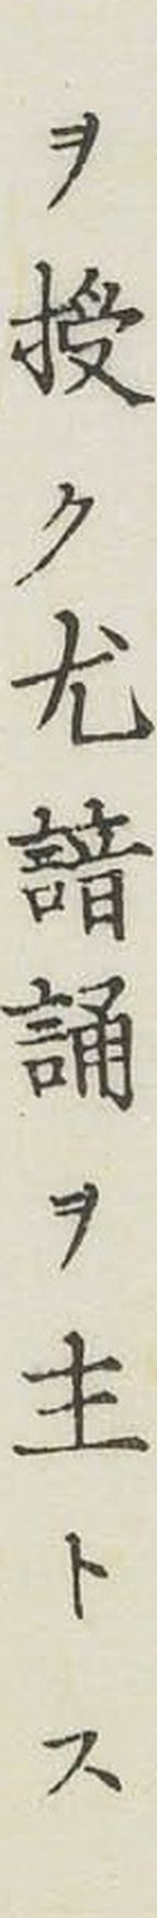ヲ授ク尤諳誦ヲ主トス
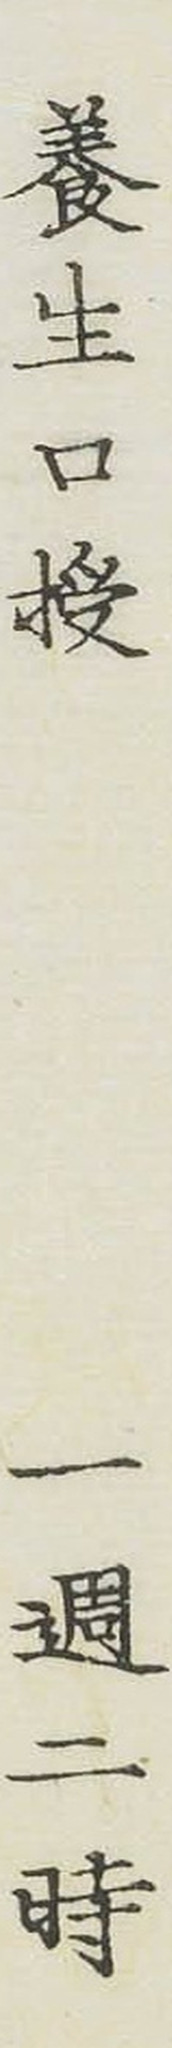養生口授一週二時
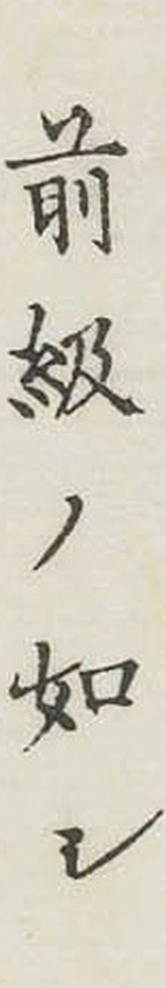前級ノ如シ
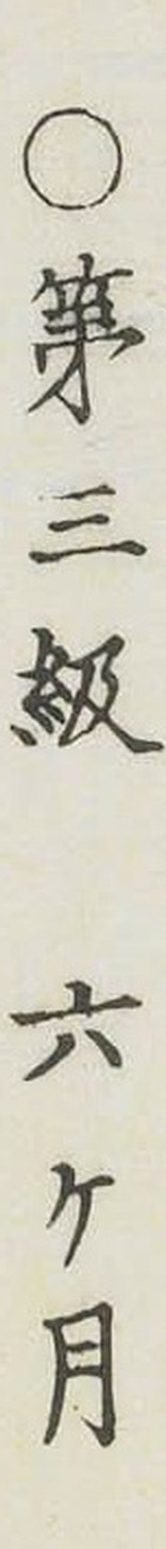○第三級六ケ月
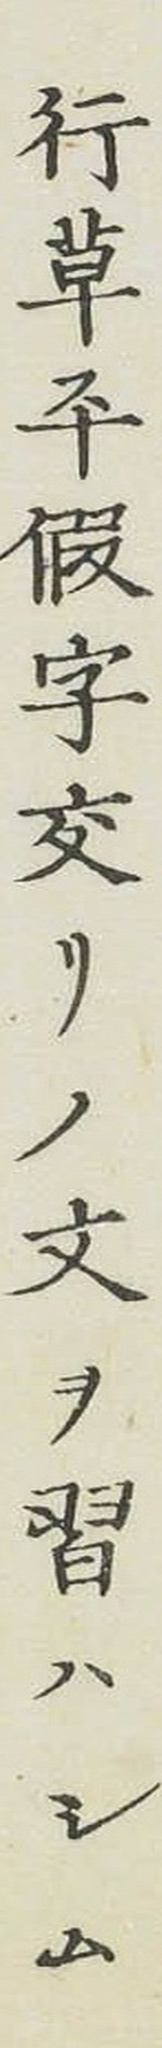行草平仮字交リノ文ヲ習ハシム
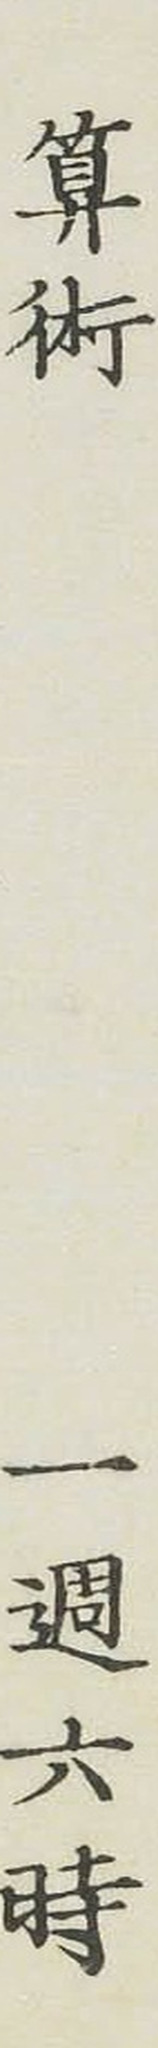算術一週六時
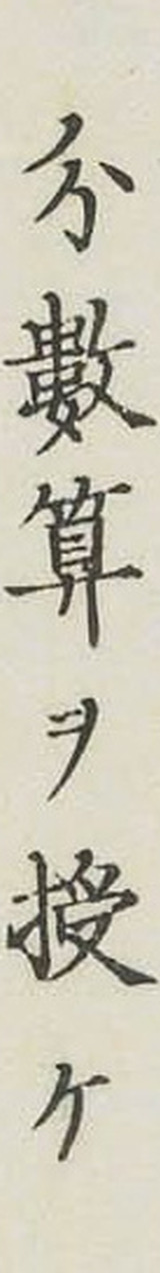分数算ヲ授ケ
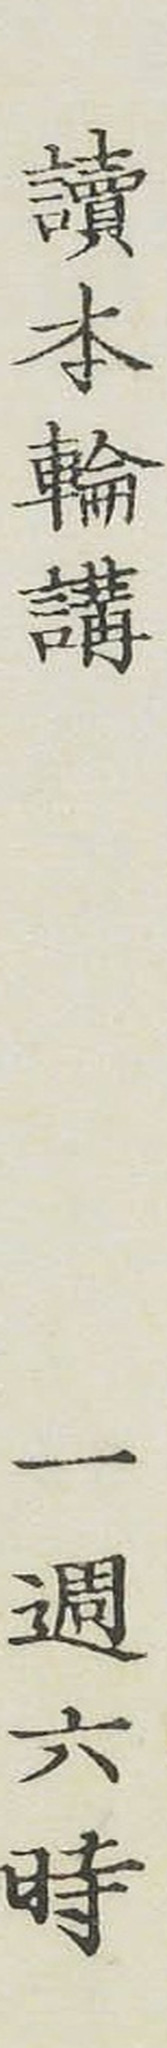読本輪講一週六時
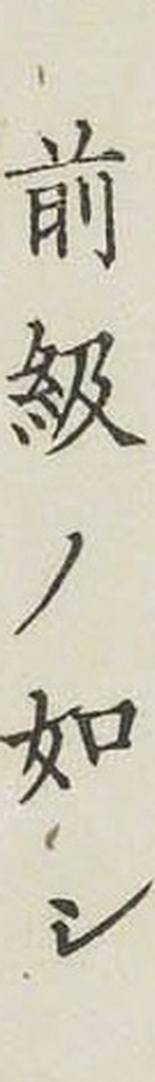前級ノ如シ
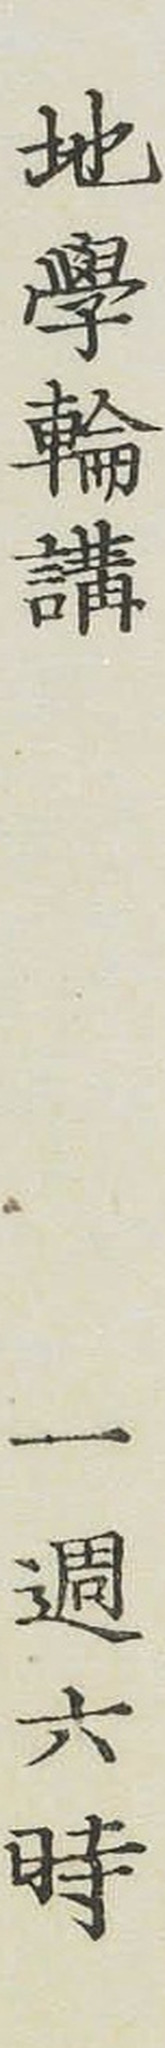地学輪講一週六時
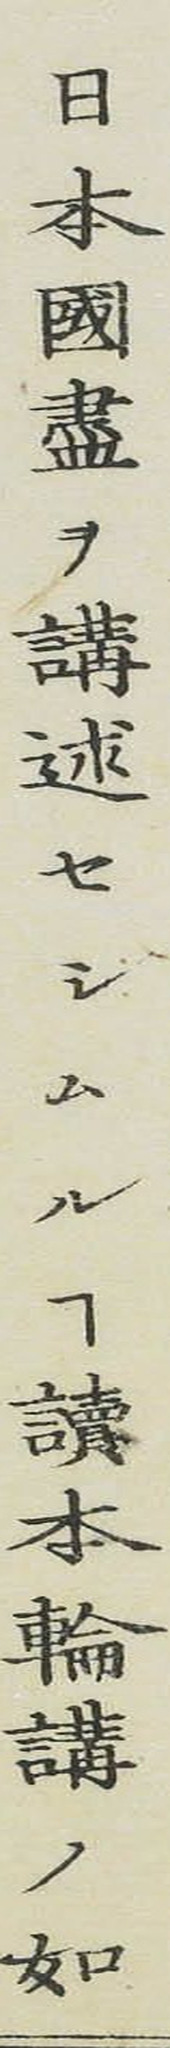日本国盡ヲ講述セシムル事読本輪講ノ如
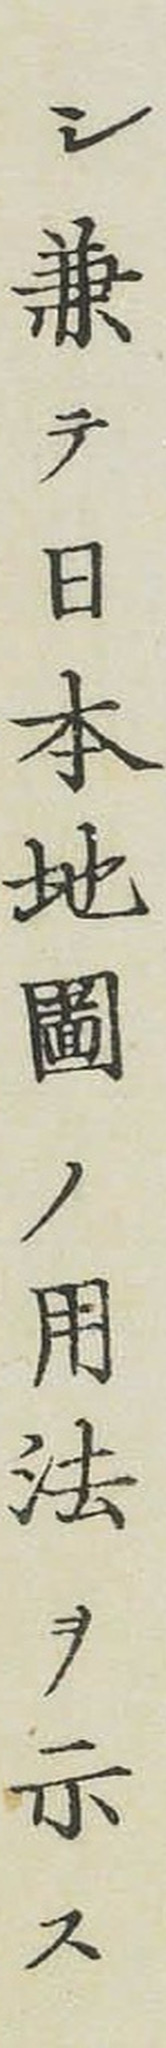シ兼テ日本地図ノ用法ヲ示ス
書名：小学教則
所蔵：東京学芸大学教育コンテンツアーカイブ
